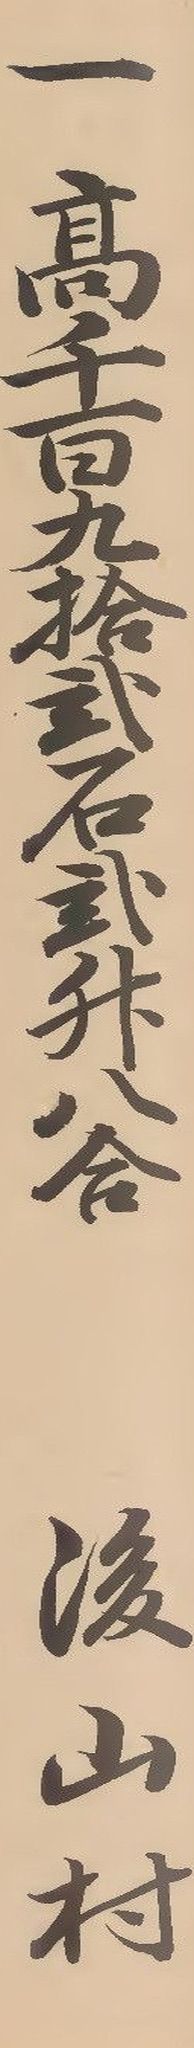一高千百九拾弐石弐升八合後山村
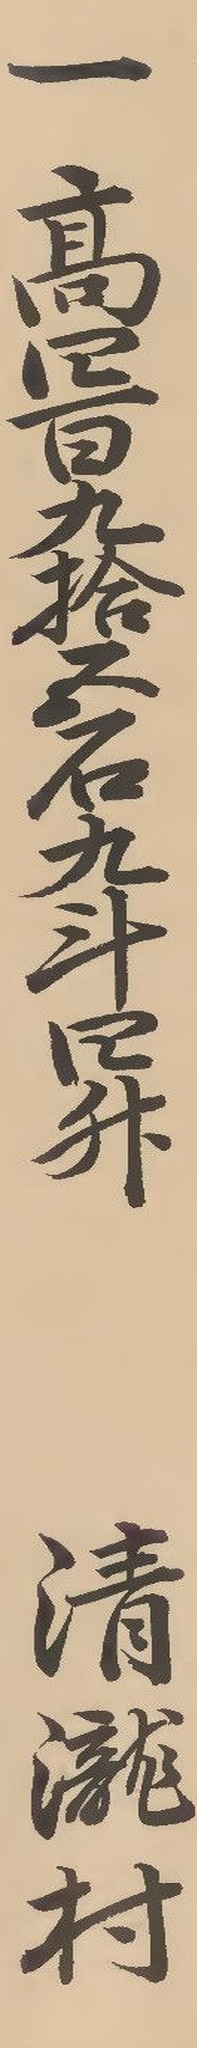一高四百九拾五石九斗四升清滝村
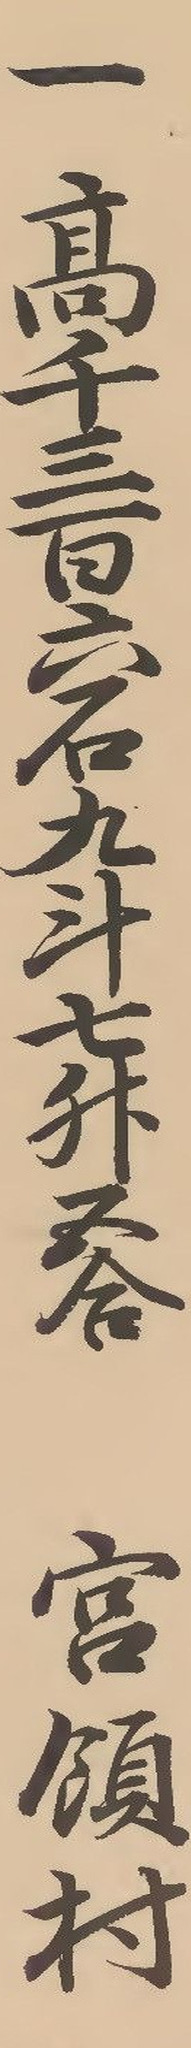一高千三百六石九斗七升五合宮領村
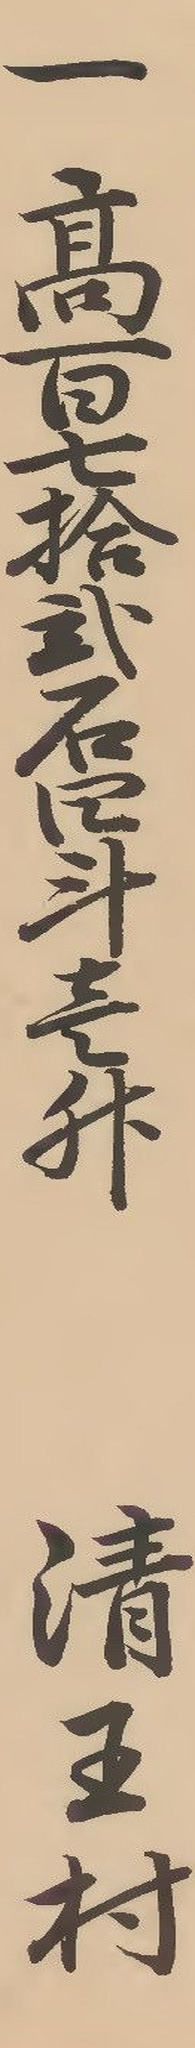一高百七拾弐石四斗壱升清王村

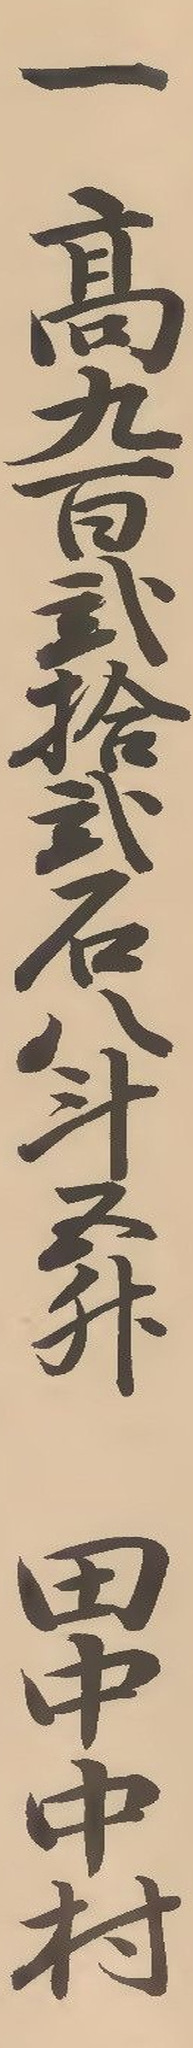一高九百弐拾弐石八斗五升田中中村
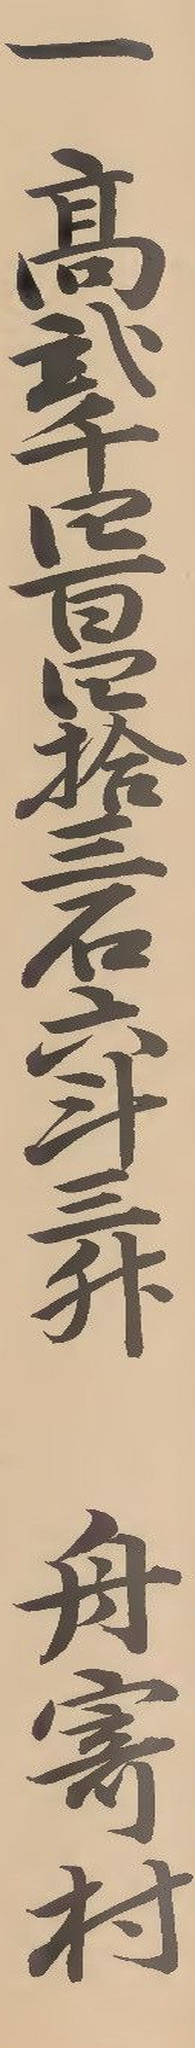一高弐千四百四拾三石六斗三升舟寄村
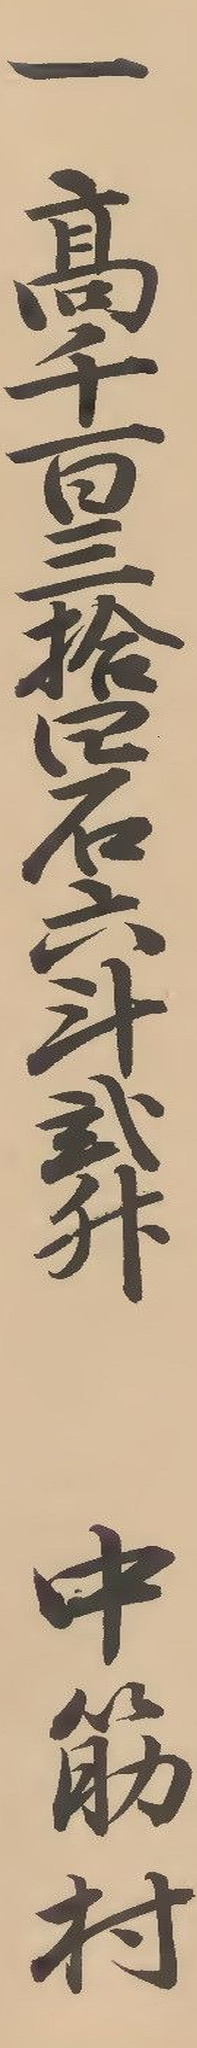一高千百三拾四石六斗弐升中筋村
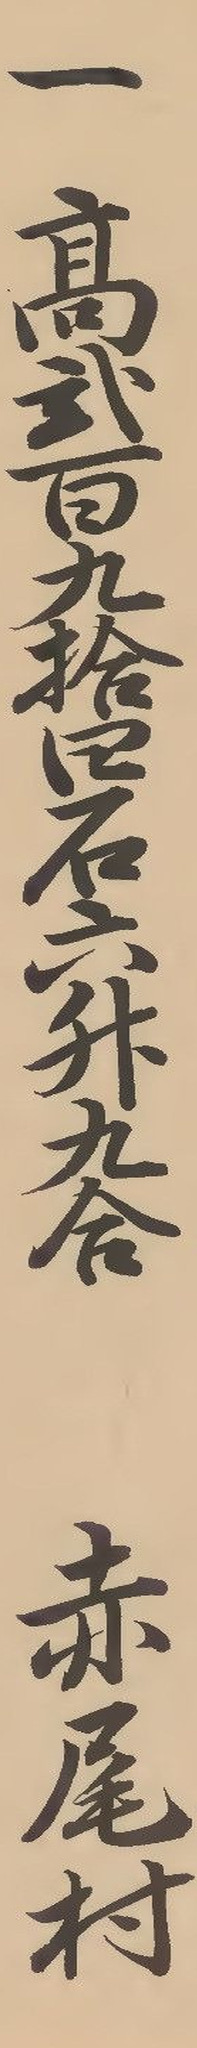一高弐百九拾四石六升九合赤尾村
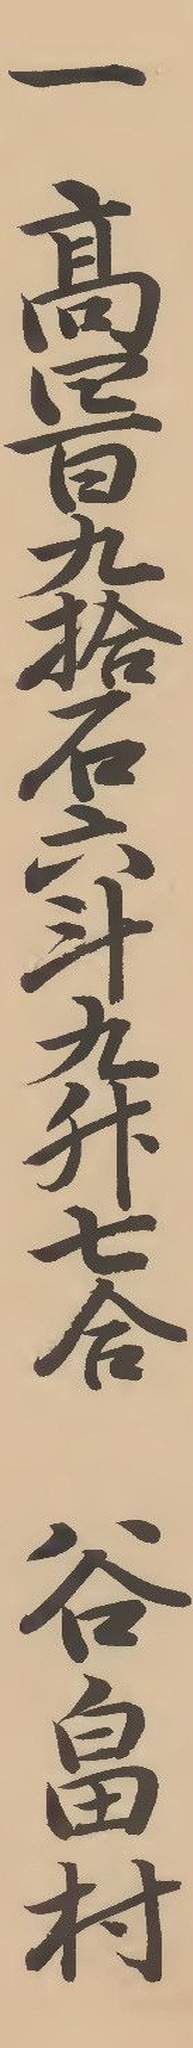一高四百九拾石六斗九升七合谷畠村

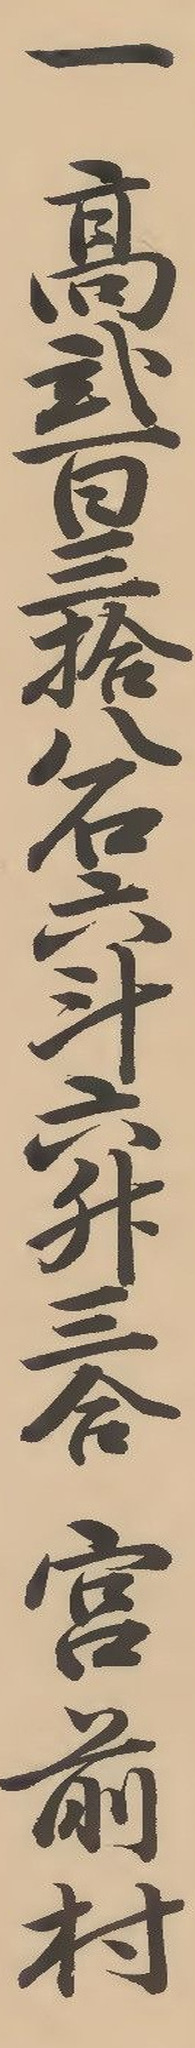一高弐百三拾八石六斗六升三合宮前村
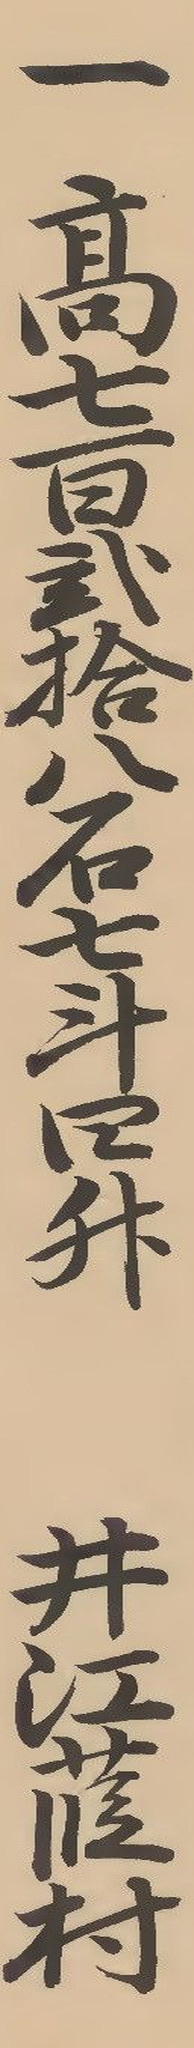一高七百弐拾八石七斗四升井江葭村
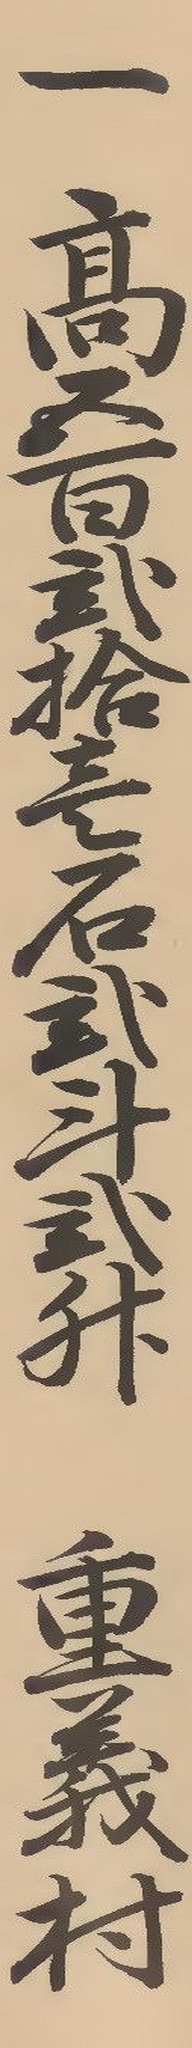一高五百弐拾壱石弐斗弐升重義村
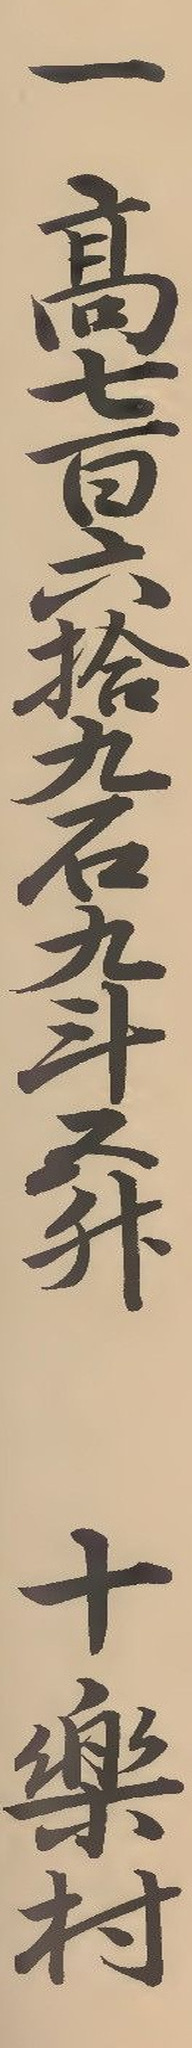一高七百六拾九石九斗五升十楽村
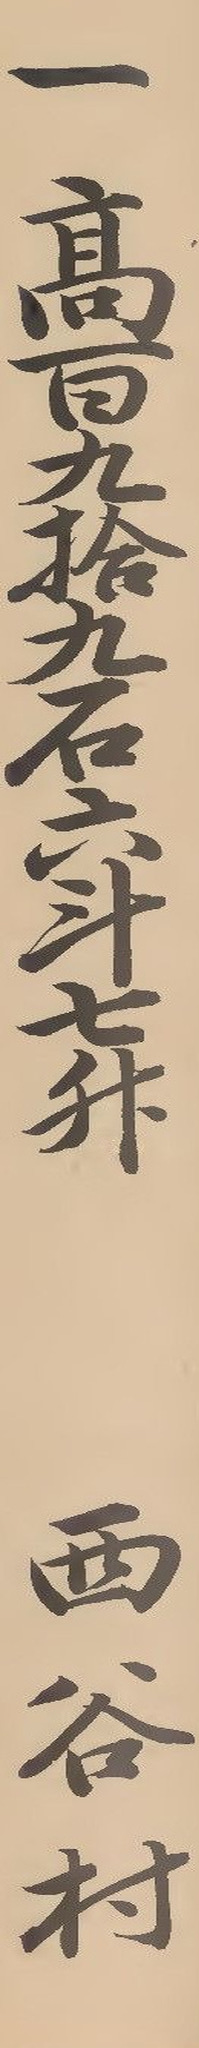一高百九拾九石六斗七升西谷村
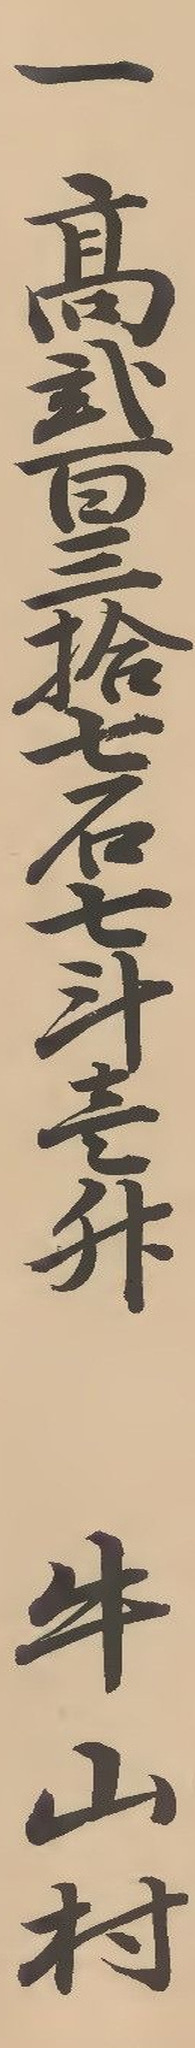一高弐百三拾七石七斗壱升牛山村
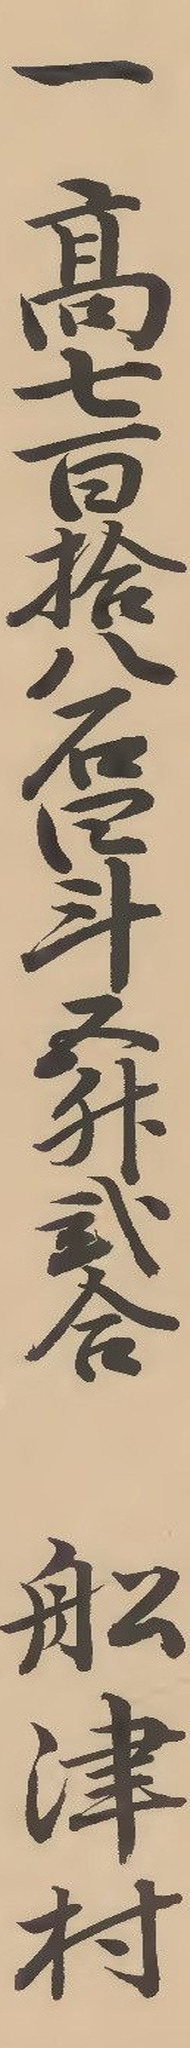一高七百拾八石四斗五升弐合船津村
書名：越前国郷帳
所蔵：国立公文書館 National Archives of Japan
